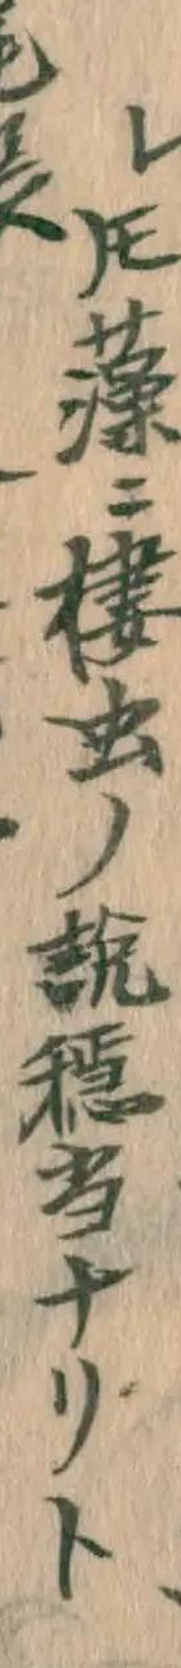レトモ藻ニ棲虫ノ説穏当ナリト
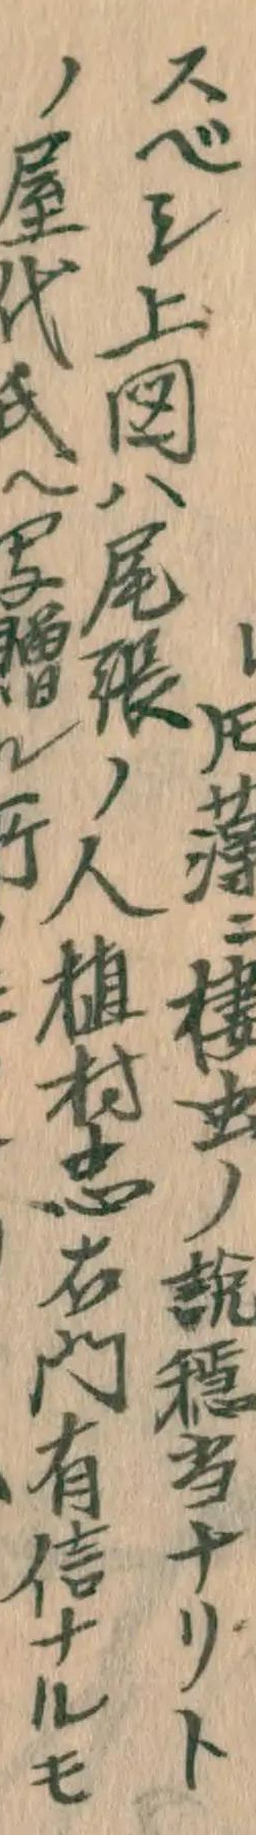スベシ上図ハ尾張ノ人植村忠右門有信ナルモ
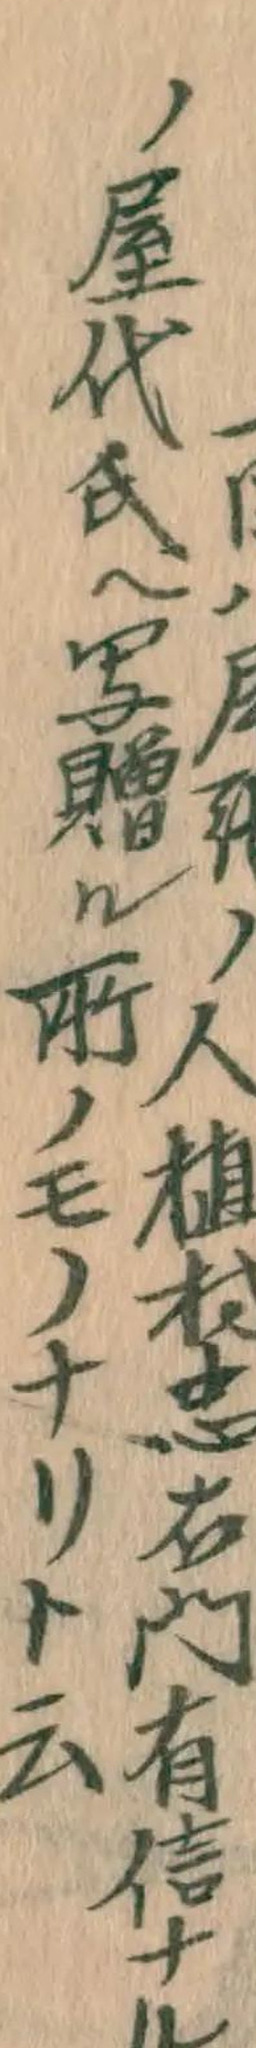ノ屋代氏ヘ写贈ル所ノモノナリト云
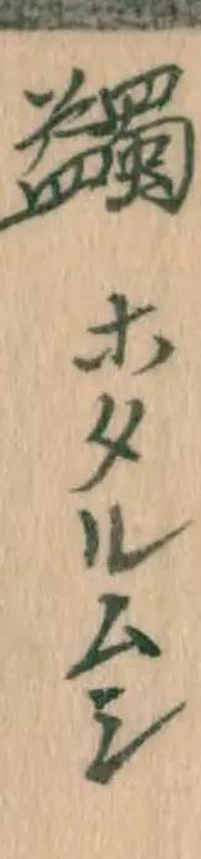蠲ホタルムシ
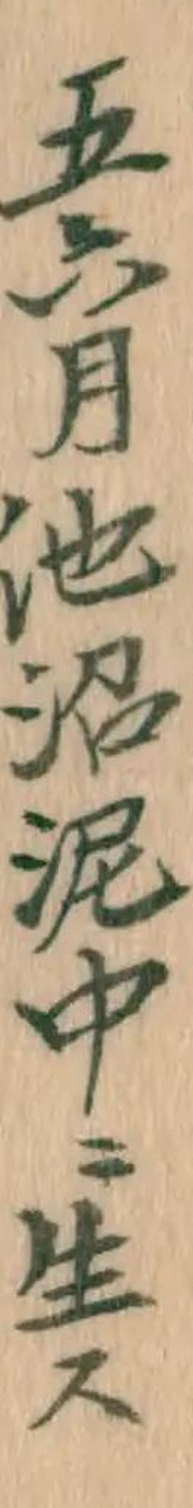五六月池沼泥中ニ生ス
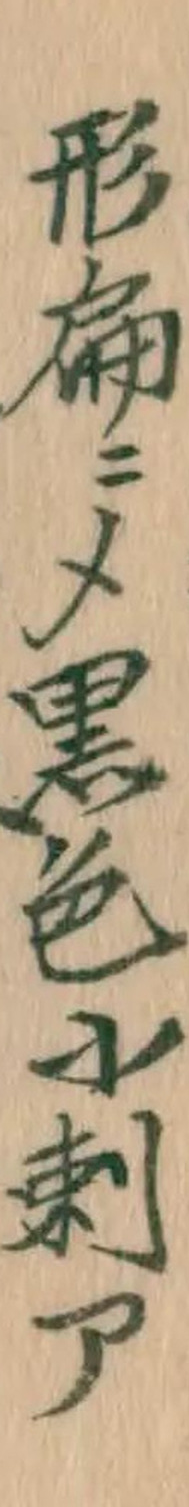形扁ニシテ黒色小刺ア
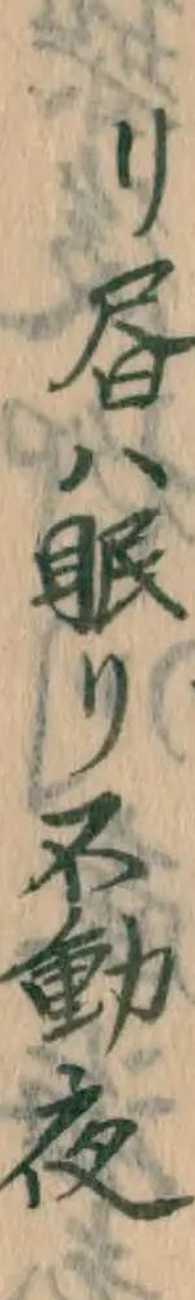リ昼ハ眠リ不動夜
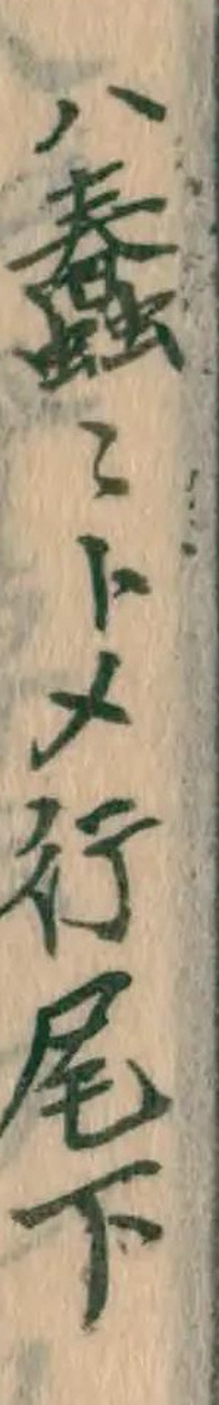ハ蠢々トシテ行尾下
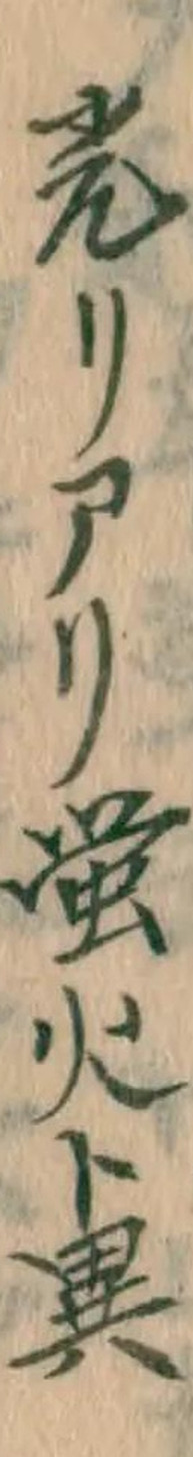光リアリ蛍火ト異
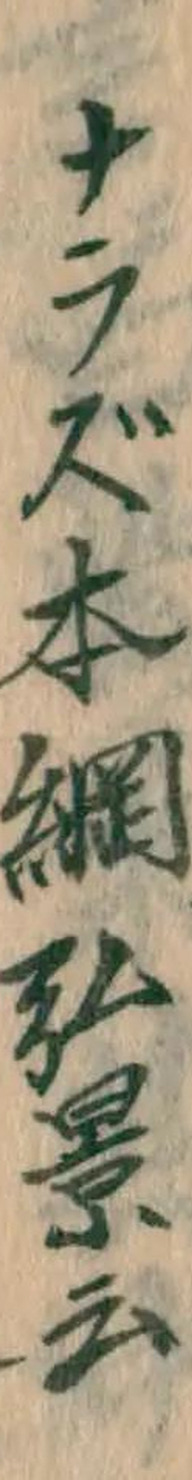ナラズ本綱弘景云
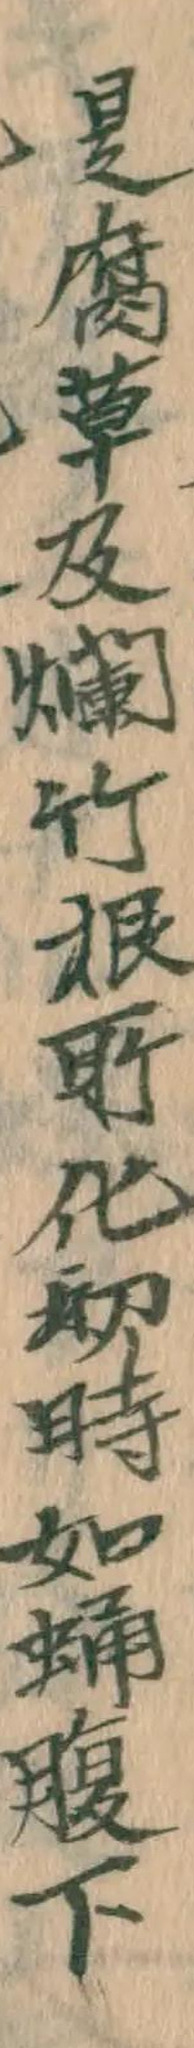是腐草及爛竹根所化初ノ時如蛹腹下
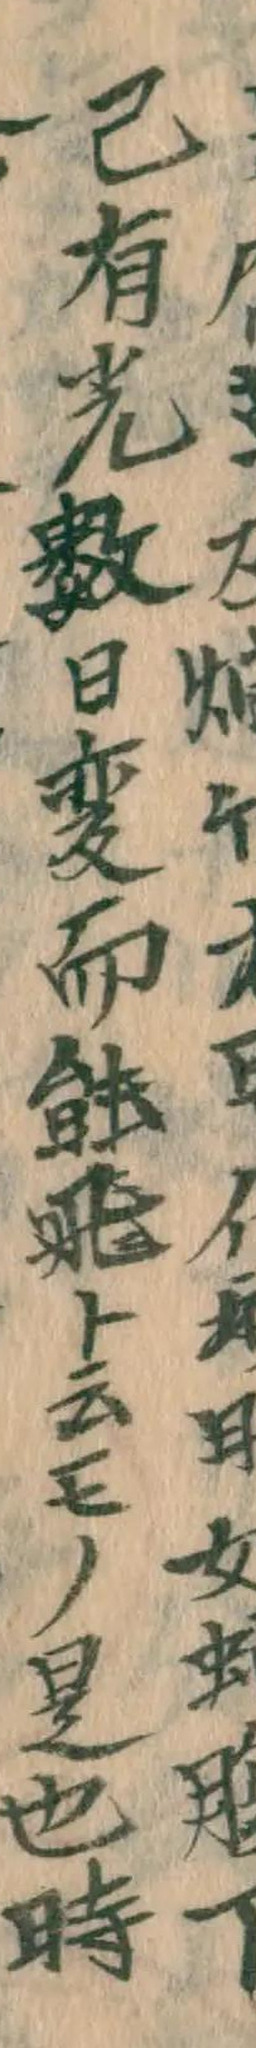已有光数日変而能飛ト云モノ是也時
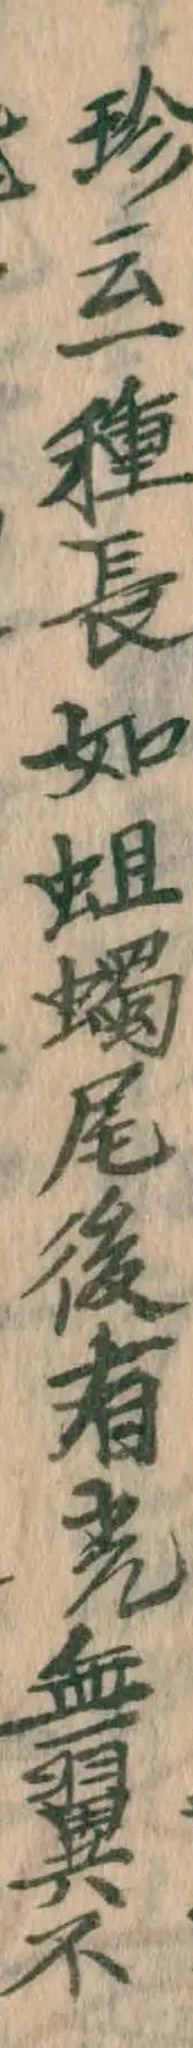珍云一種長如蛆蠋尾後有光無翼不
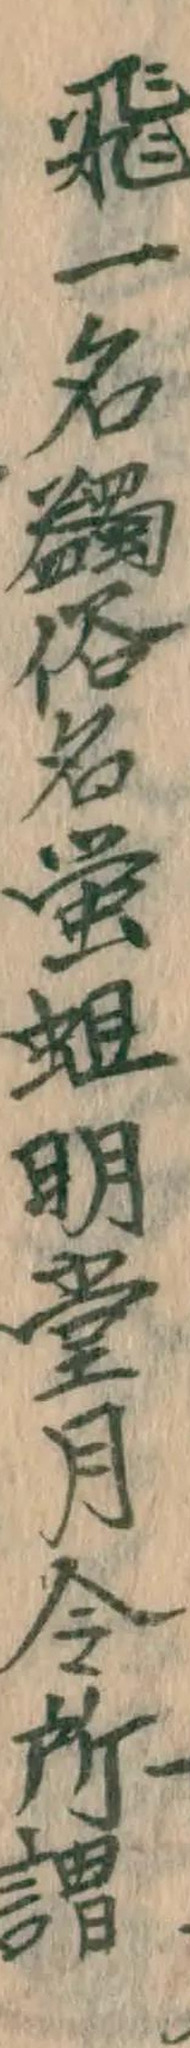飛一名蠲俗名蛍蛆明堂月令所謂
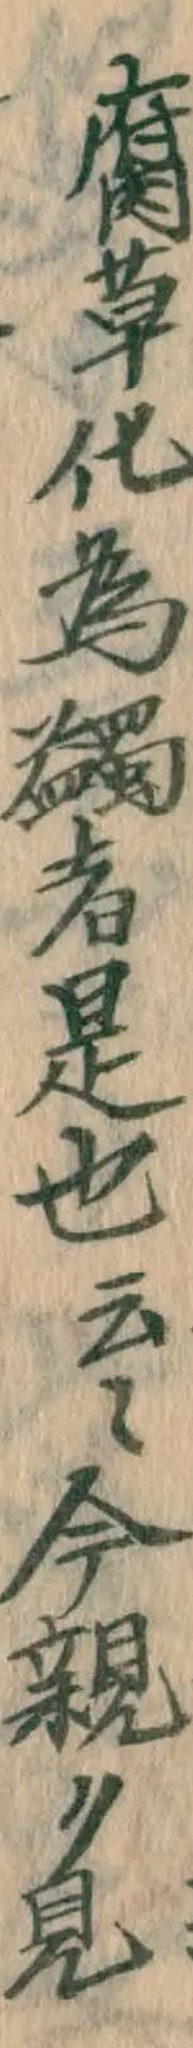腐草化為蠲者是也云々今親ク見
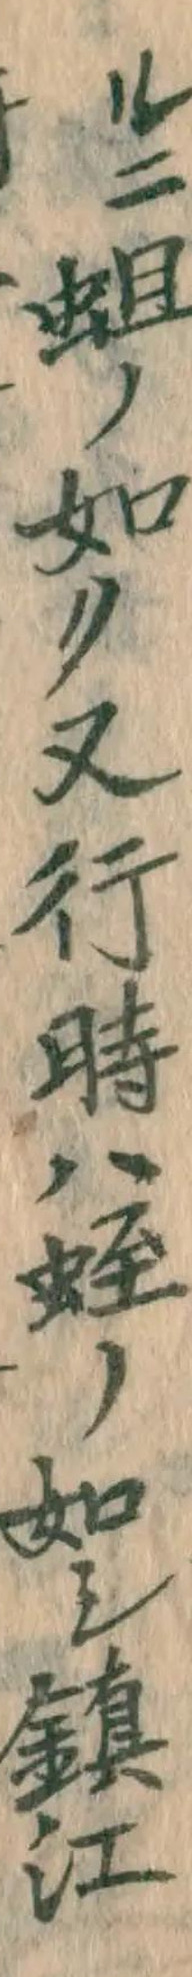ルニ蛆ノ如ク又行時ハ蛭ノ如シ鎮江
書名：千蟲譜 3巻. [1]
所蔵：国立国会図書館 National Diet Library, JAPAN
